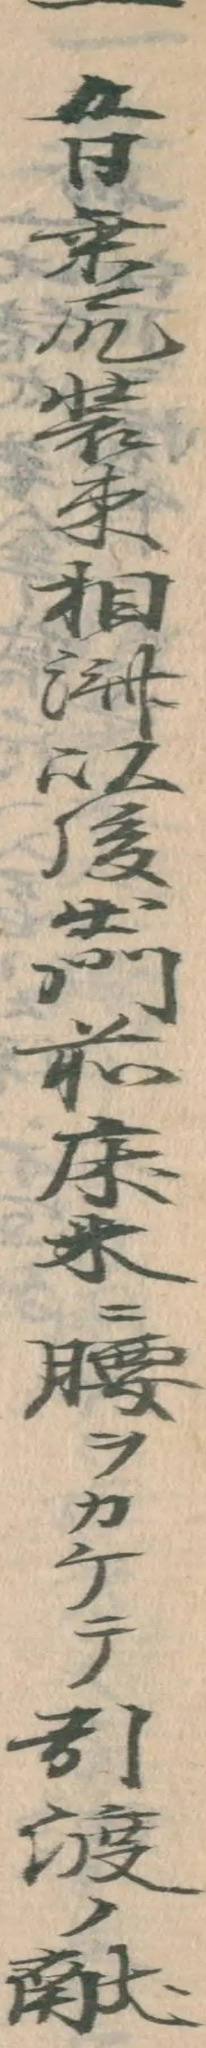一五日乗尻装束相済以後出門前床木ニ腰ヲカケテ引渡ノ献
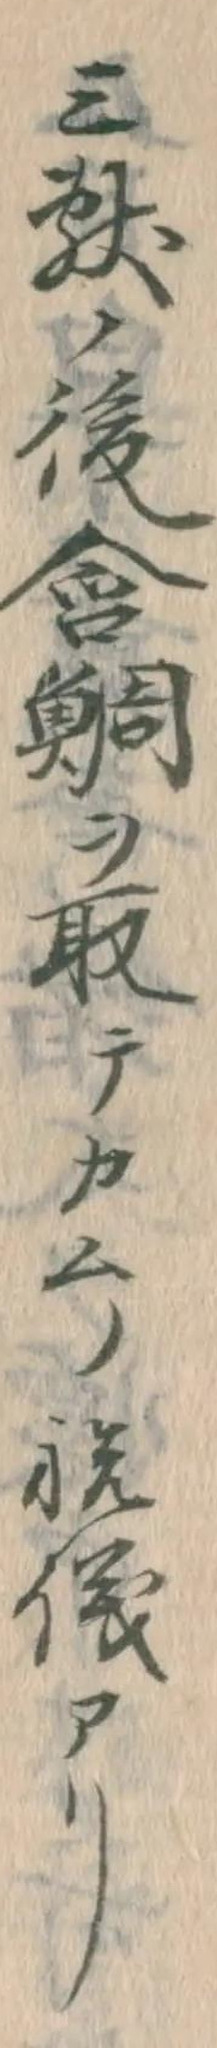三献ノ後含鯛ヲ取テカムノ祝儀アリ
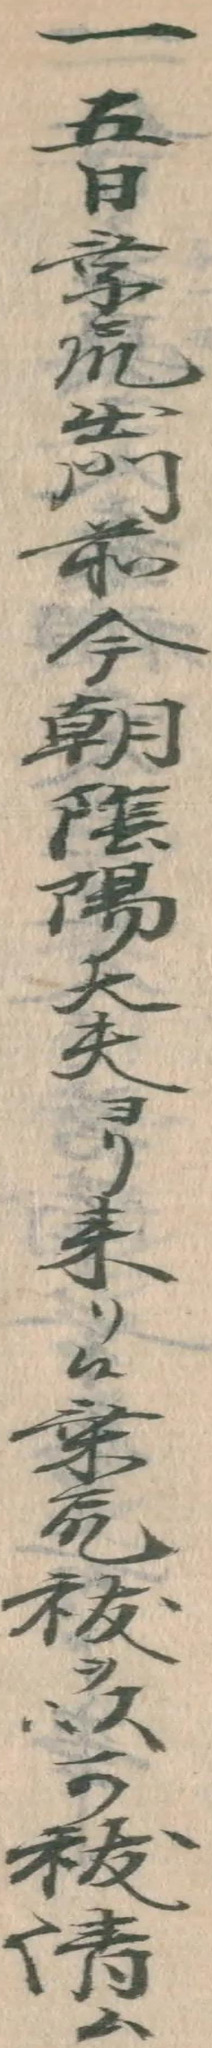一五日乗尻出門前今朝陰陽大夫ヨリ来リ候乗尻祓ヲ以可祓清ム
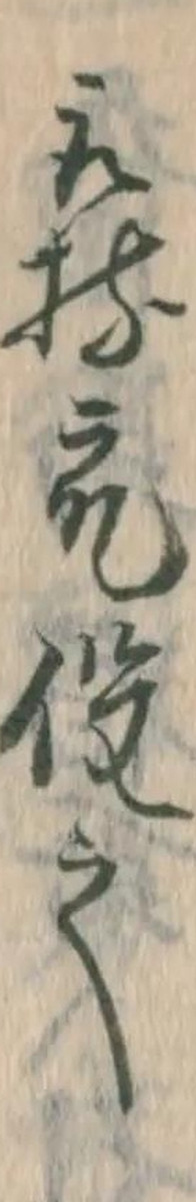取持衆役之
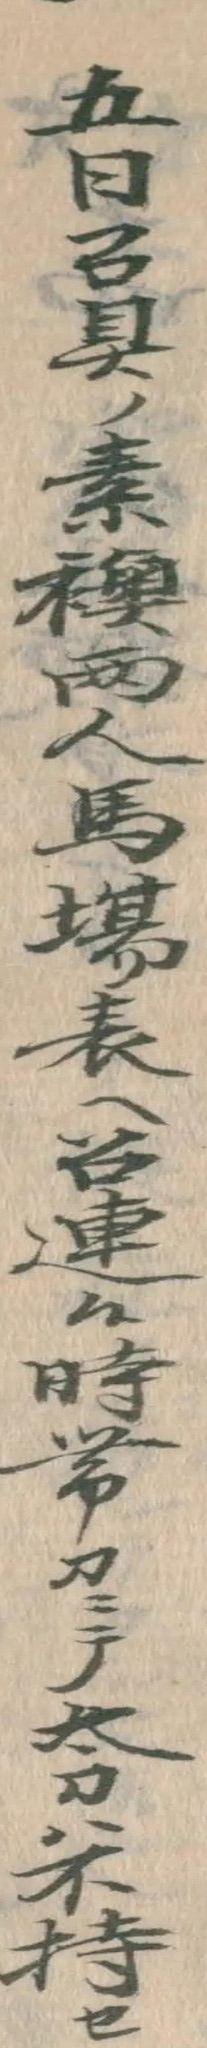一五日召具ノ素襖両人馬場表へ召連候時帯刀ニテ太刀ハ不持セ
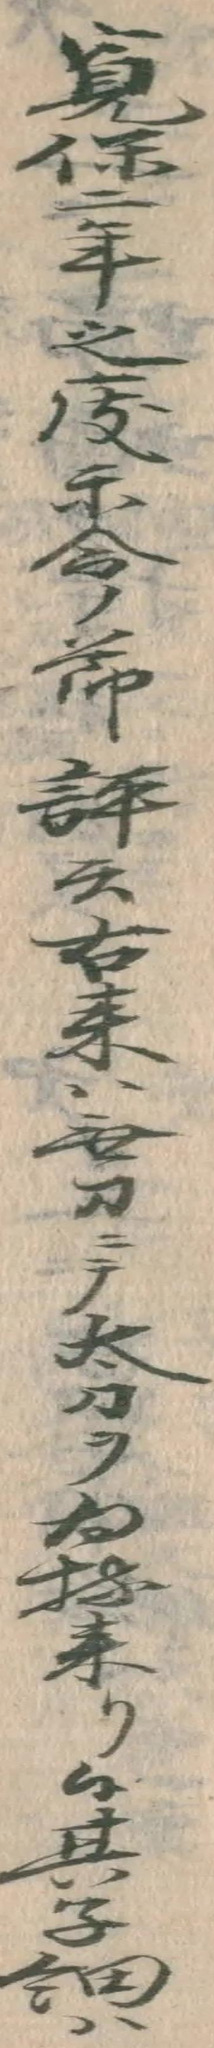寛保二年之度示合ノ節評云右来ハ無刀ニテ太刀ヲ為持来リ候其子細ハ
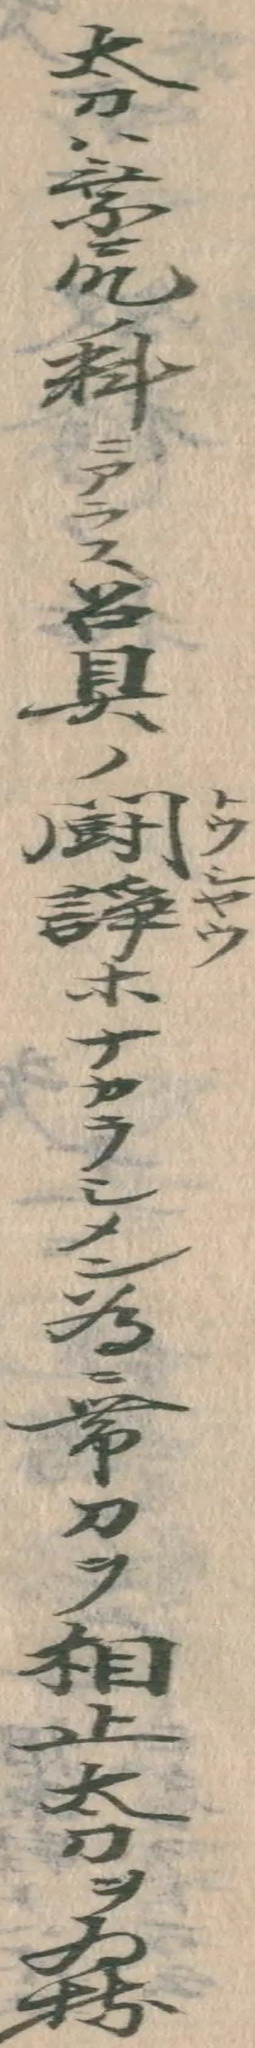太刀ハ乗尻ノ科ニアラス召具ノ闘諍等ナカラシメン為ニ帯刀ヲ相止太刀ヲ為持
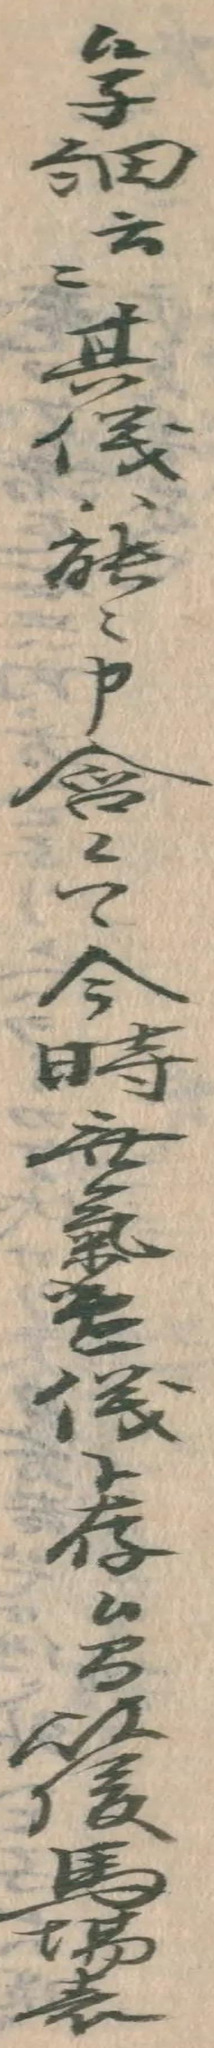候子細云々其儀ハ能々申含候ハヽ今時無気遣儀ト存候間以後馬場表
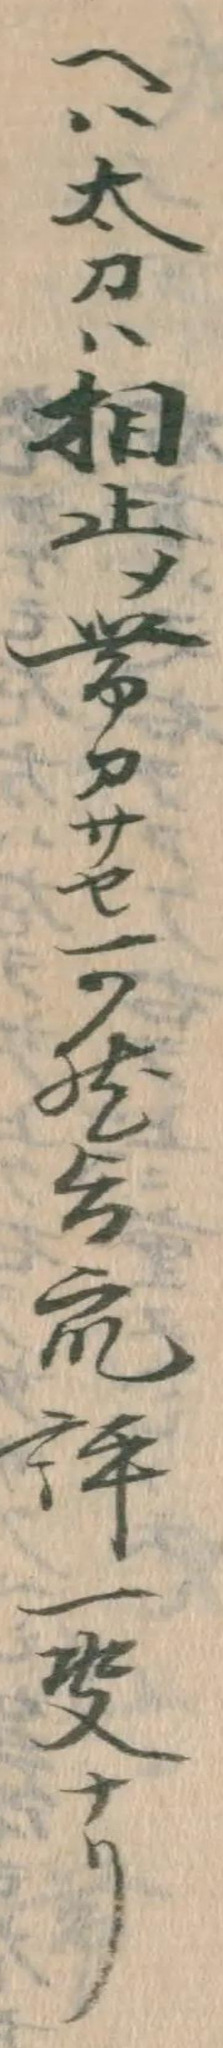ヘハ太刀ハ相止メ帯刀サセ可然旨衆評一決ナリ
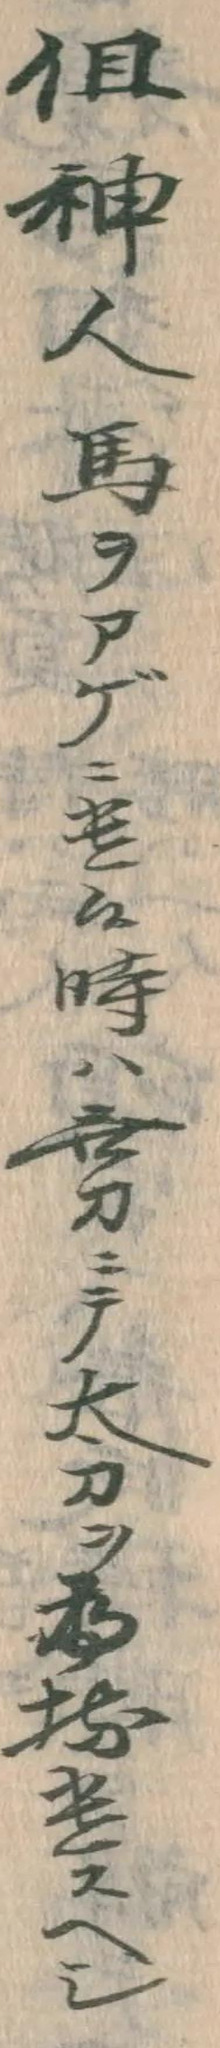但神人馬ヲアゲニ遣候時ハ無刀ニテ大刀ヲ為持遣スヘシ
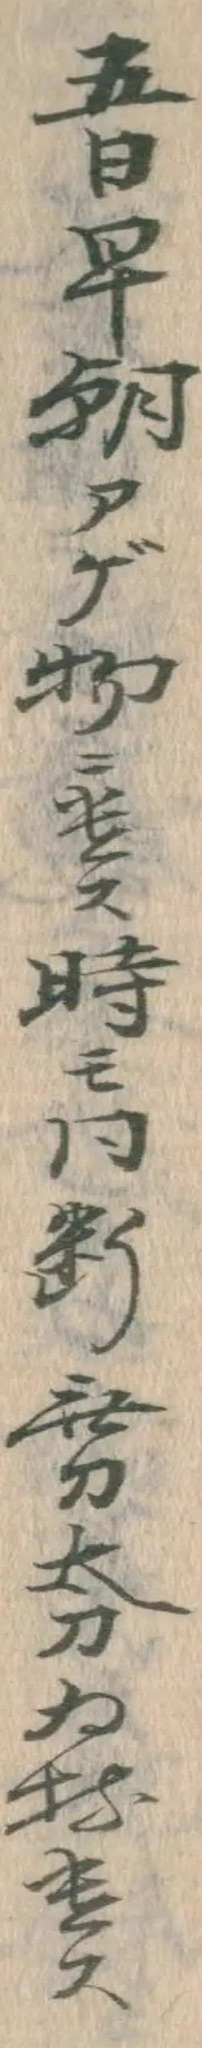五日早朝アゲ物ニ遣ス時モ同断無刀太刀為持遣ス
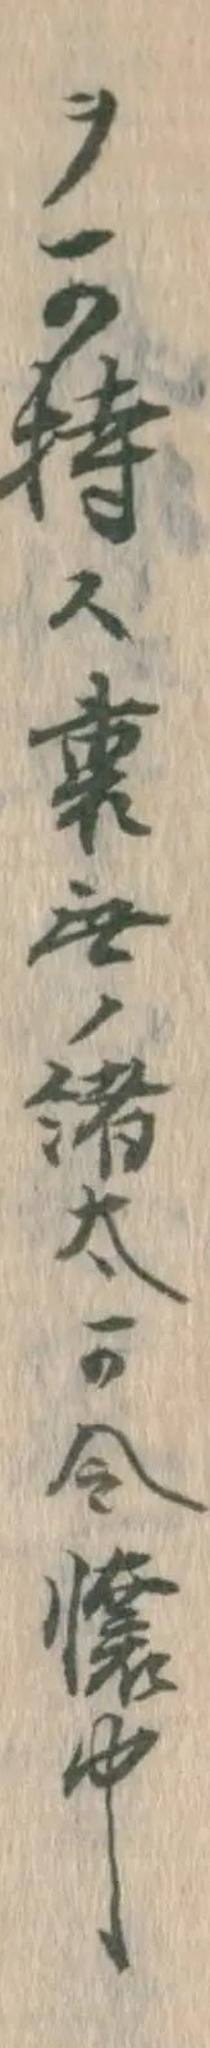ヲ可持ス裏無ノ緒太可令懐中
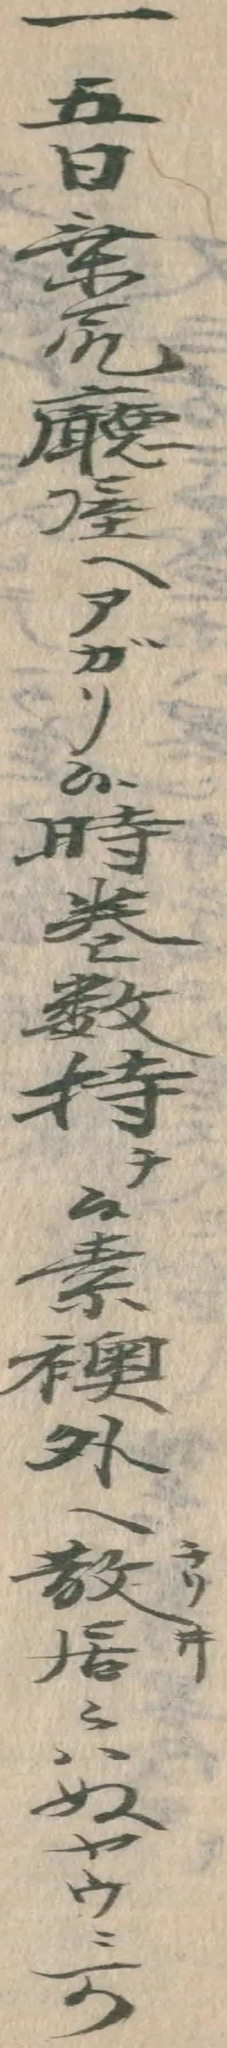一五日乗尻庁屋ヘアガリ候時巻数持チ候素襖外へ散居候ハぬヤウニ可
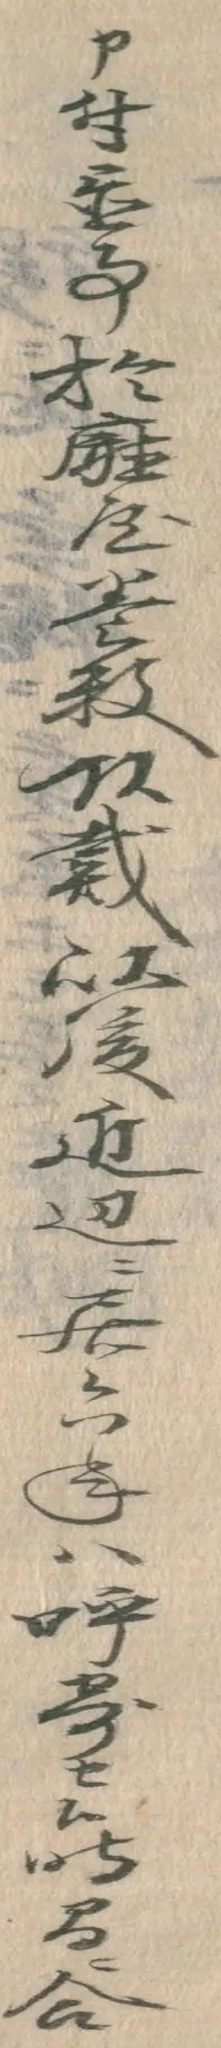申付置事於庁屋巻数頂戴以後近辺二居候ハネハ呼寄セ候時間ニ合
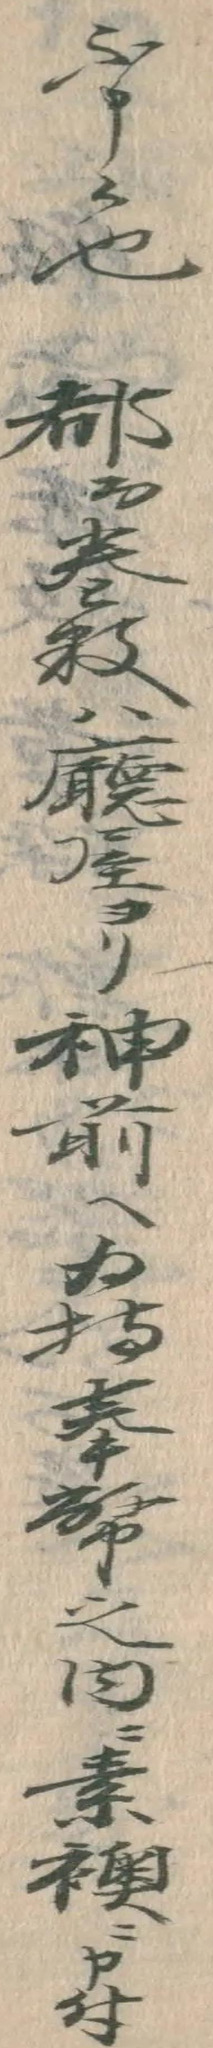不申候也都而巻数ハ庁屋ヨリ神前へ為持奉幣之内ニ素襖ニ申付
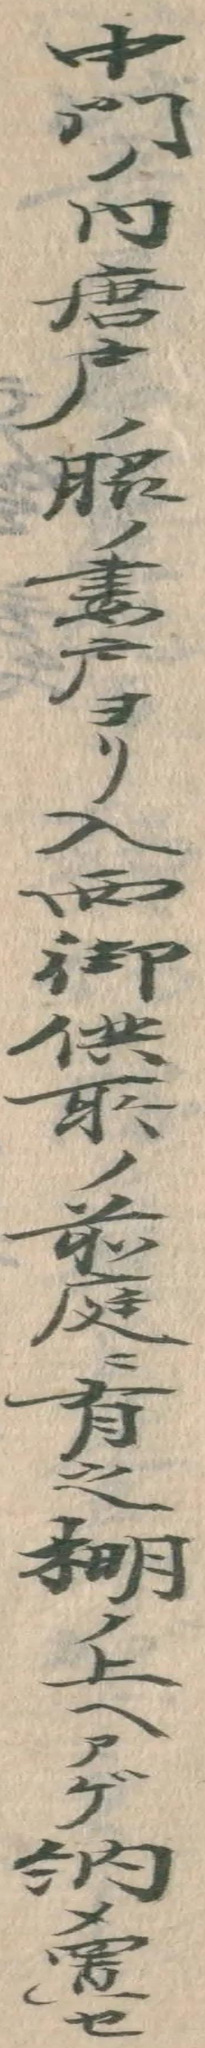中門ノ内唐戸ノ脇ノ妻戸ヨリ入西御供所ノ前庭ニ有之棚ノ上ヘアゲ納メ置セ
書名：賀茂社記録. 第11冊
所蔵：国立国会図書館 National Diet Library, JAPAN
